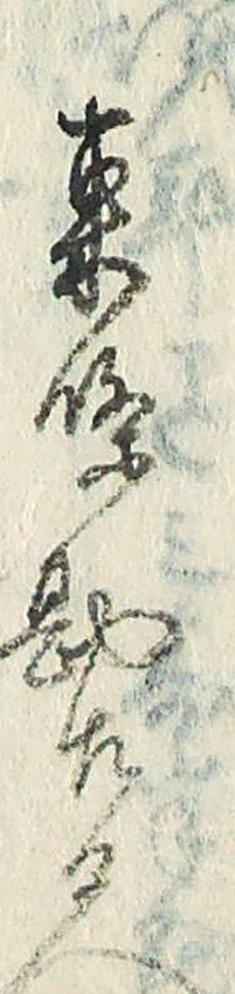東條勘左衛門
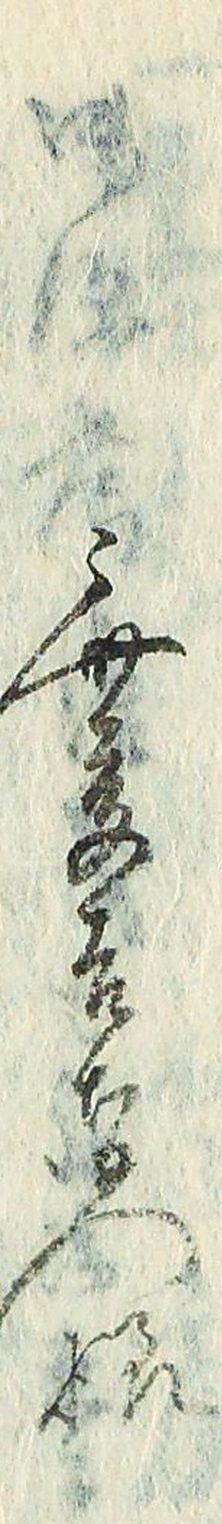斎藤吉左衛門様
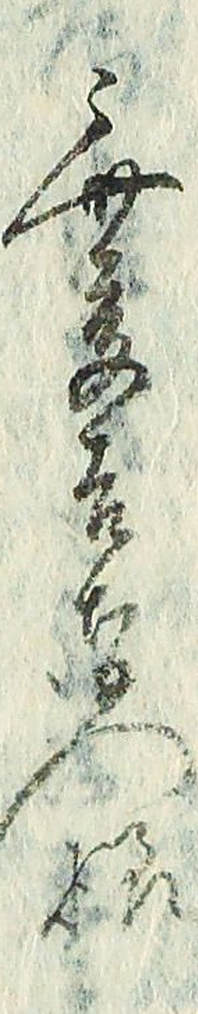斎藤吉左衛門様
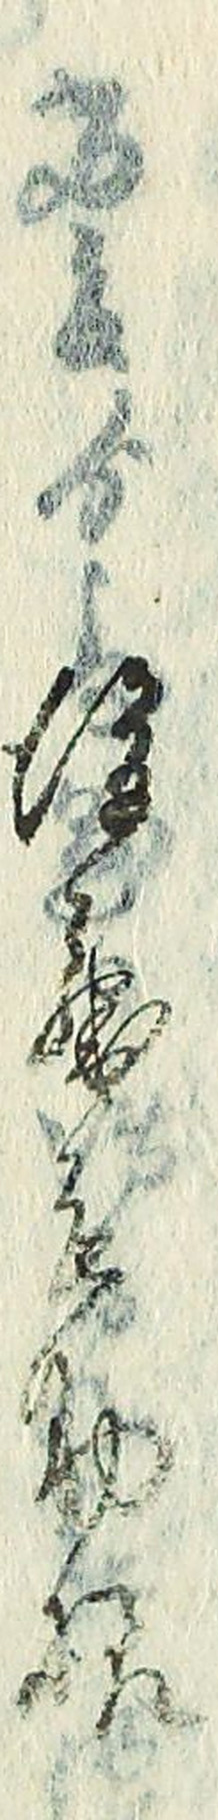後藤庄助様
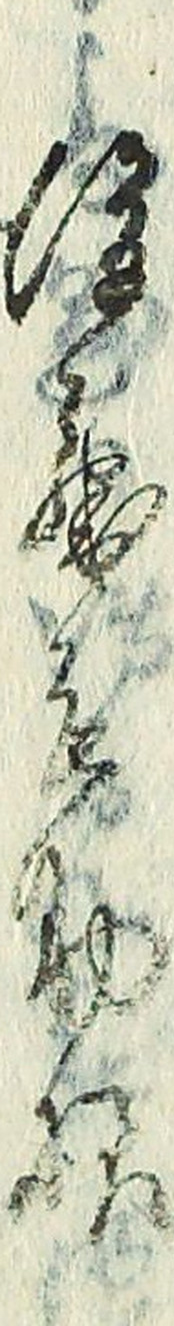後藤庄助様
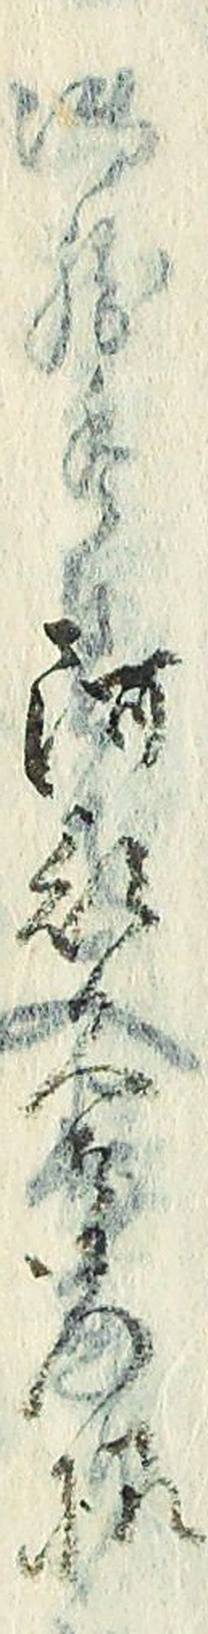阿部久左衛門様
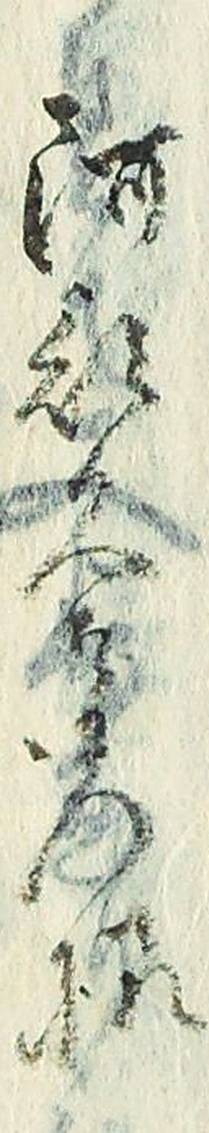阿部久左衛門様
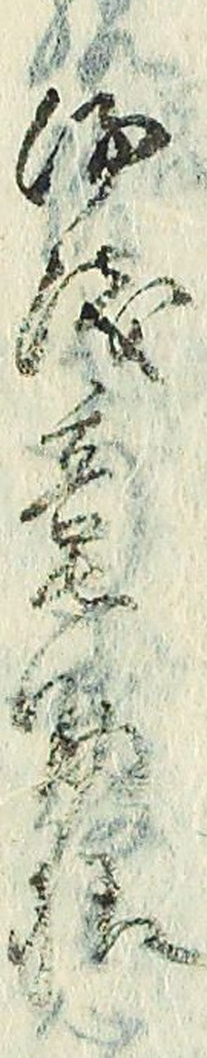湯浅竜助様
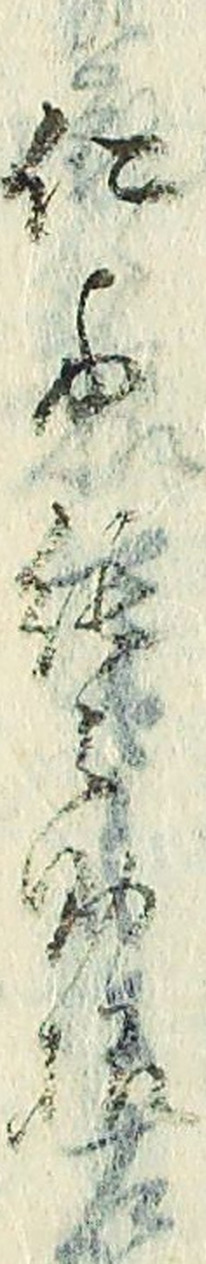仁木純之助様

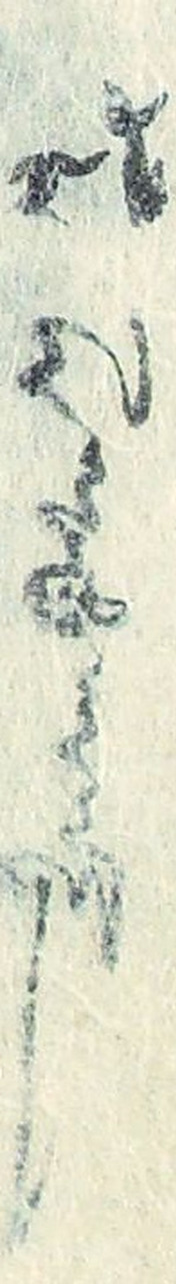六月十五日
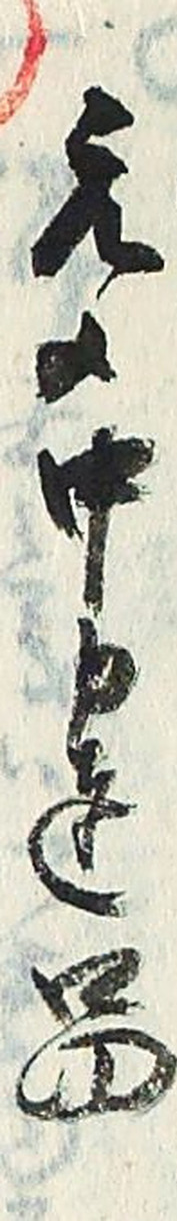元〆中申達品
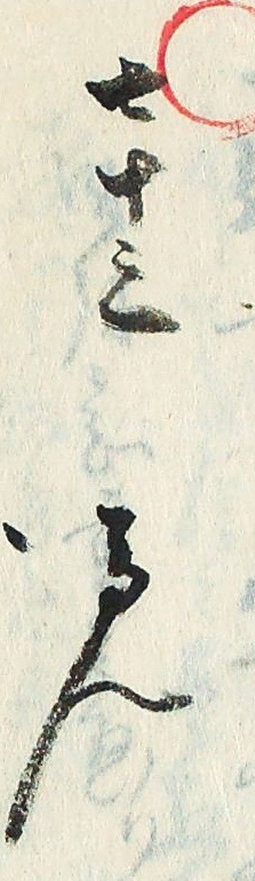七十三覚
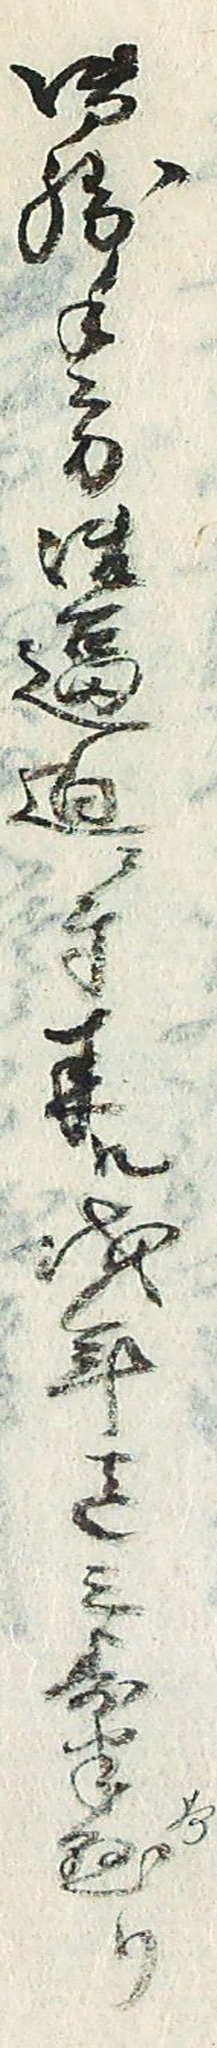御勝手方御逼迫ニ付来ル戌年迄三歩半歩懸り
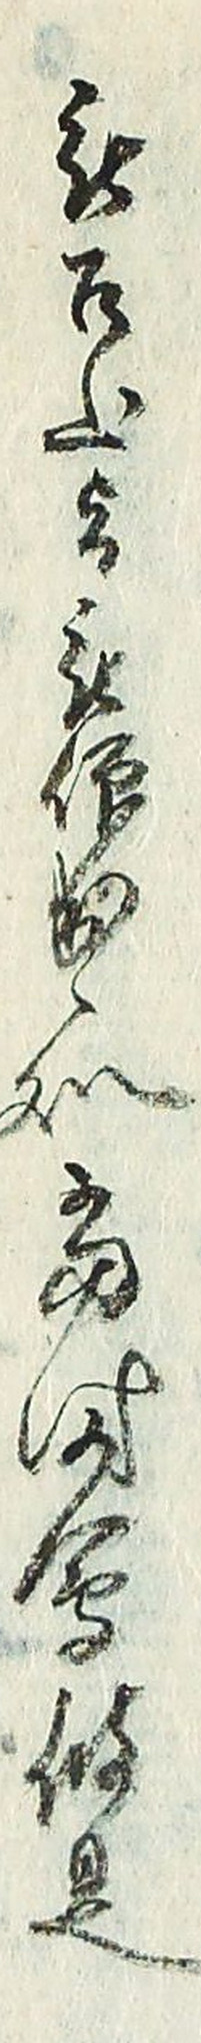被召上旨被仰出候処當時會彼是
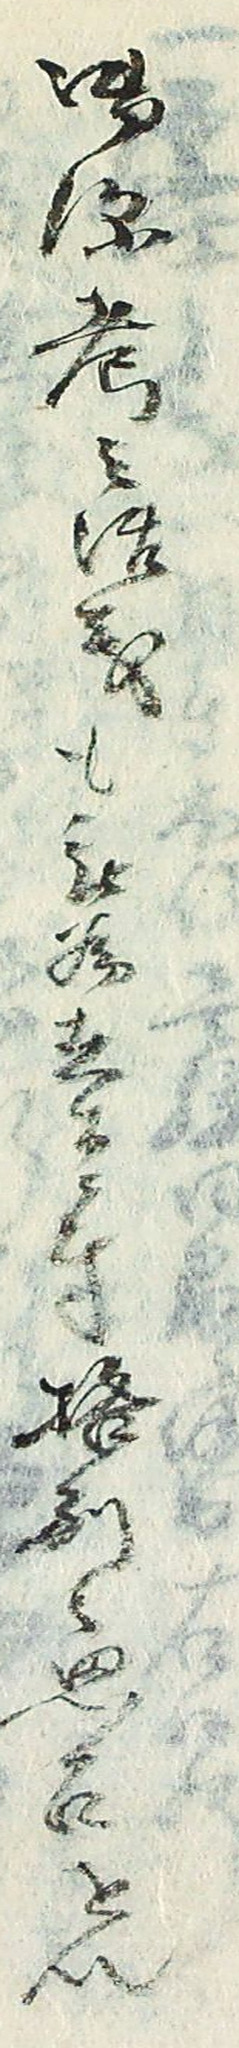御深考之御義も被為在候ニ付格別之思召を以
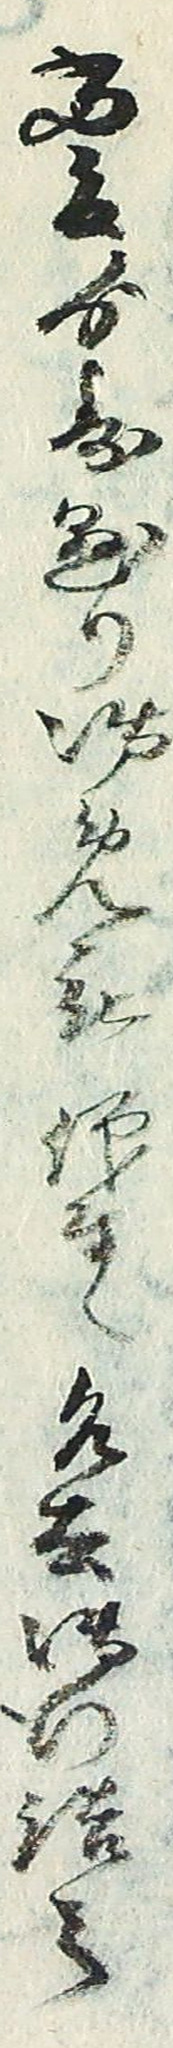當夏ゟ歩懸り御免被仰付候乍去御行詰之
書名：諸御趣意書并御下知向之写
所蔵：鳴門教育大学 Naruto University of Education
